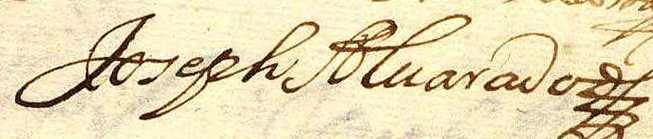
Joseph Aluarado
